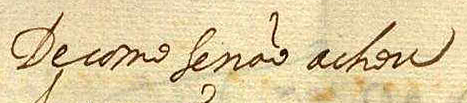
De como se naõ achou
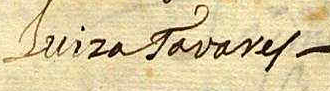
Luiza Tavares -
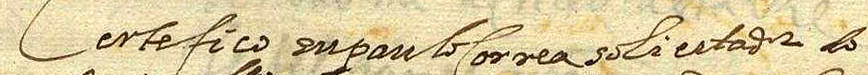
Certefico Eu paulo Correa solicitador do
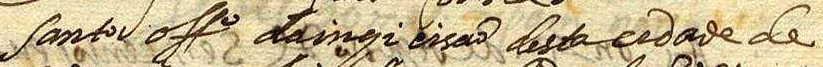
Santo offo da inqicisaõ desta cidade de
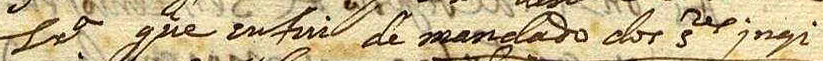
Lx.a que Eu fui de mandado dos sres jnqi
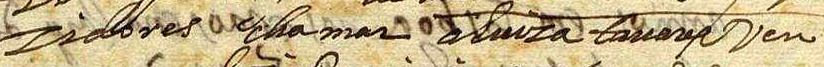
Zidores chamar a Luiza tauares Veu
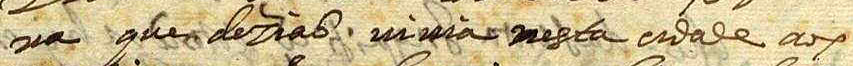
ua que deziaõ uiuia nesta cidade aos
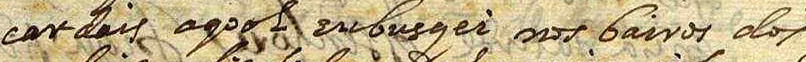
cardais a qoal Eu busqei nos bairos dos
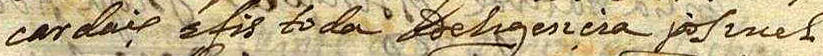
cardais E fis toda a deligencia posiuel
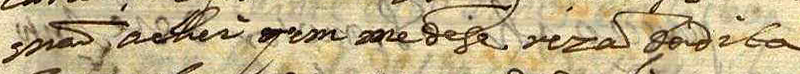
E naõ achei qem me dese rezā da dita
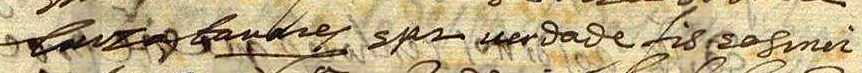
luiza tauares E por uerdade fis E asinei
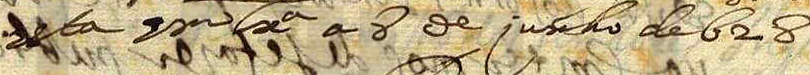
Esta Em lxa a 8 de junho de 628
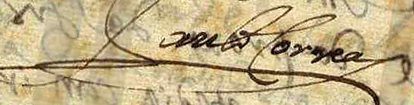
Paulo Correa
